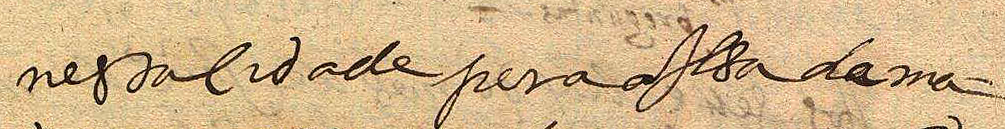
nesta Cidade pera a Jlha da ma
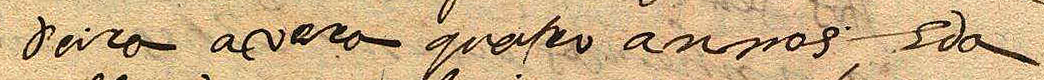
deira avera quatro annos E da
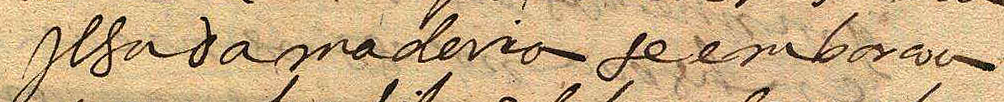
Jlha da madeira se embarcou
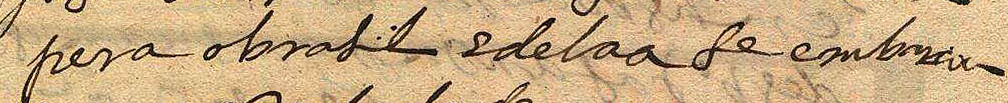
pera o brasiL E de laa se embarcou
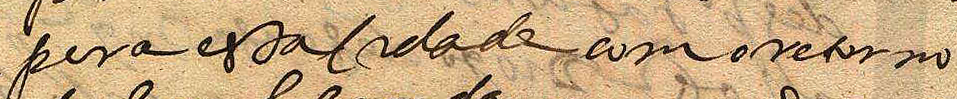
pera esta Cidade com o retorno
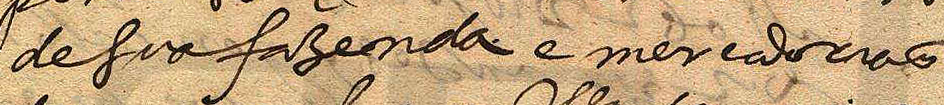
de sua fazenda e mercadoria q̄
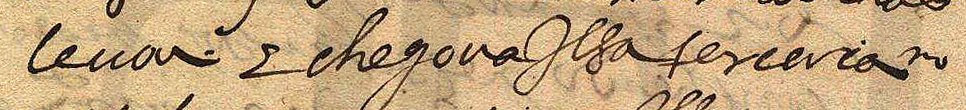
leuou E chegou a Jlha terceira no
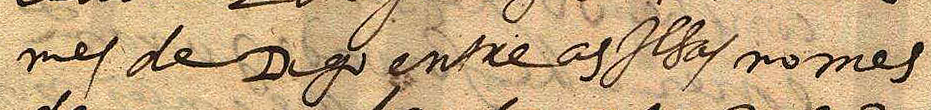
mes de Digo entre as Jlhas no mes
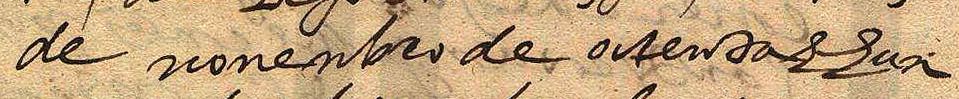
de nouembro de oitenta E hum
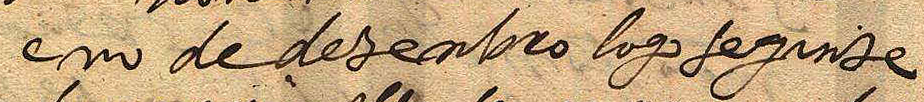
e no de dezenbro logo seginte
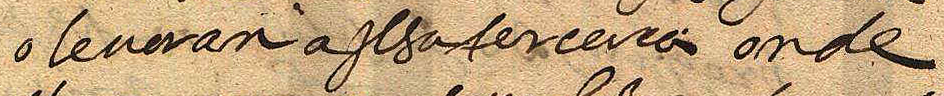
o leuaram a Jlha terceira onde
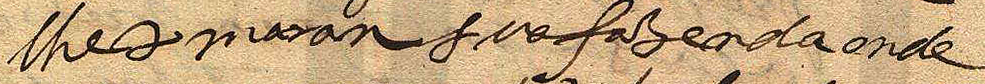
lhe tomaram sua fazenda onde
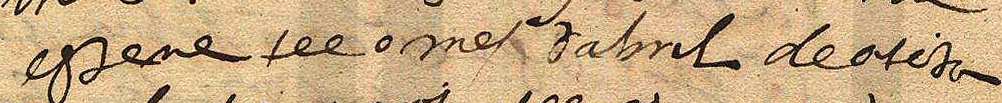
esteue tee o mes dabriL de oitēta
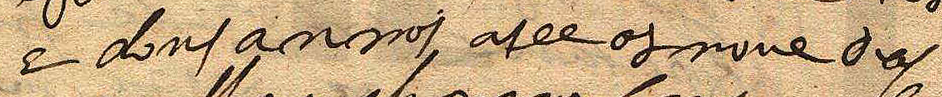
E dous annos atee os noue dias
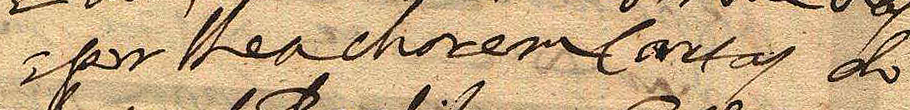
E por lhe acharem Cartas do
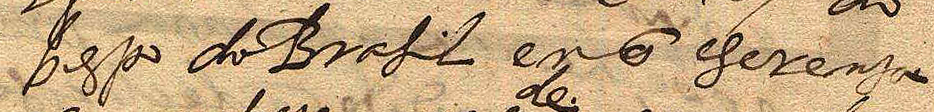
bispo do BrasiL em q̄ escreuja
